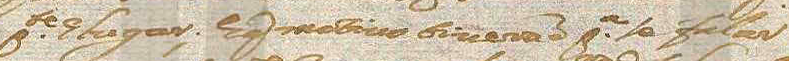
p.te E lugar. E q̄ motiuo tiueraõ p.a se falar
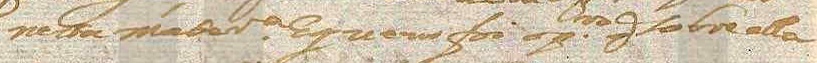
nesta mater.a E quem foi o p.ro q̄ sobre ella
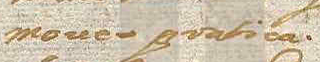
moueo pratica.
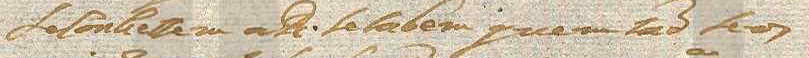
se Conhessem a R. se sabem quem saõ seos
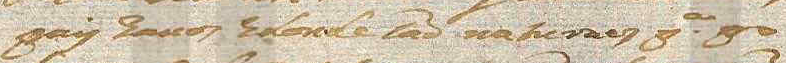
pais E auos E donde saõ naturaes pa. po
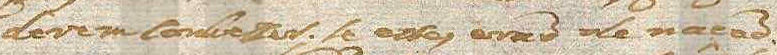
derem conhesser; se estes eraõ de naçaõ;
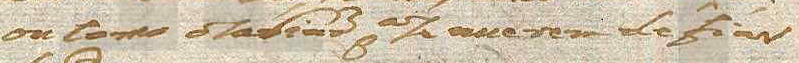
ou como o sabiaõ pa se auerem de fiar
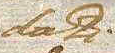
da R.
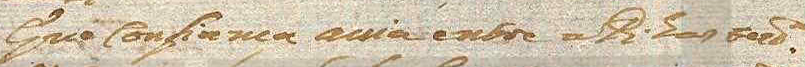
Que Confiança auia entre a R. E as test.as
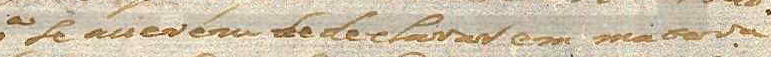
p.a se auerem de declarar em mater.a
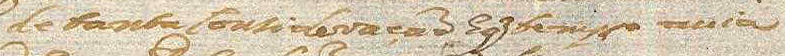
de tanta Consideraçaõ E q̄ tempo auia
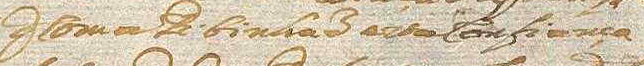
q̄ com a R. tinhaõ esta Confiança
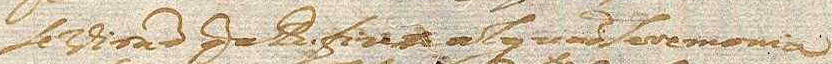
se virão q̄ a R. fizese alguā seremonia
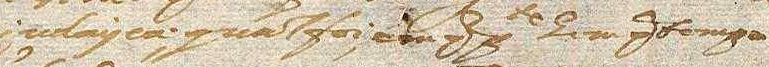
judayca; qual foi, em q̄ pte E em q̄ tempo
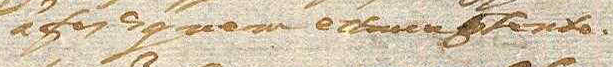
a fes E quem estaua p̄sente.
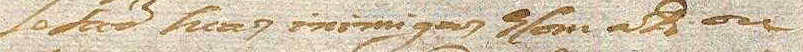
se saõ suas inimigas E Com a R ou
